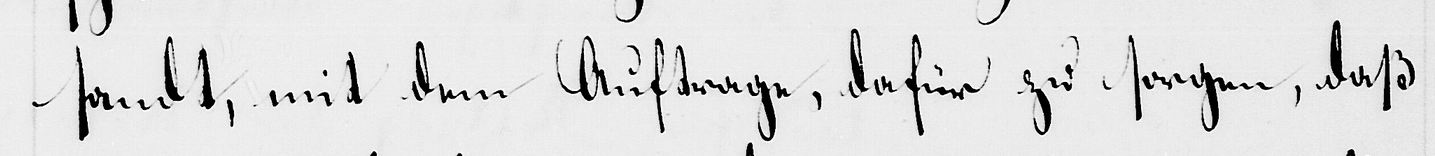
sandt, mit dem Auftrage, dafür zu sorgen, daß
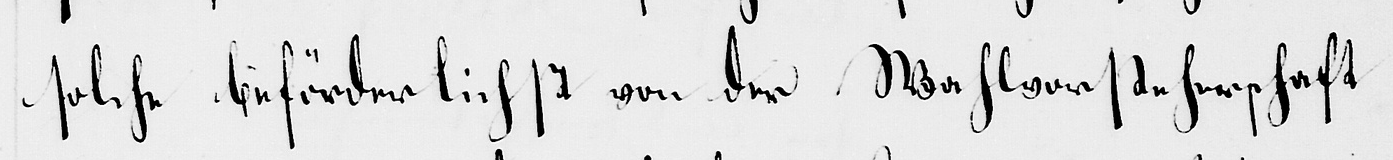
solche beförderlichst von der Wahlvorsteherschaft
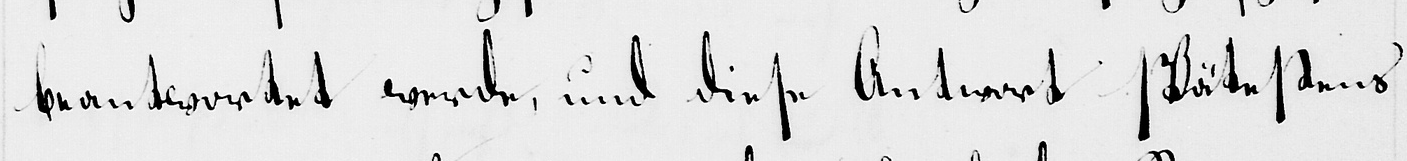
beantwortet werde, und diese Antwort spätestens
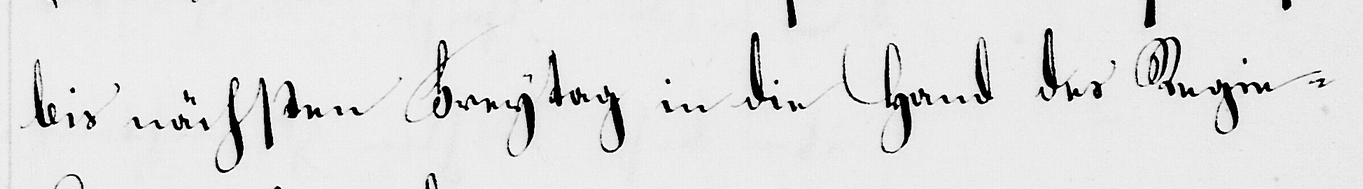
bis nächsten Freytag in die Hand des Regie¬
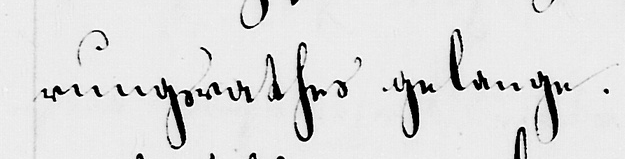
rungsrathes gelange.
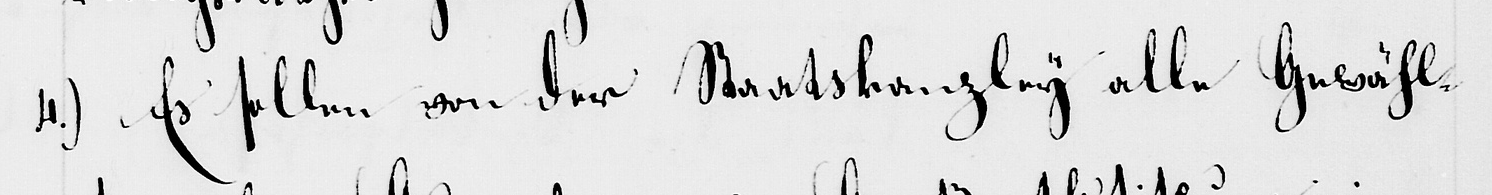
4.) Es sollen von der Staatskanzley alle Gewähl¬
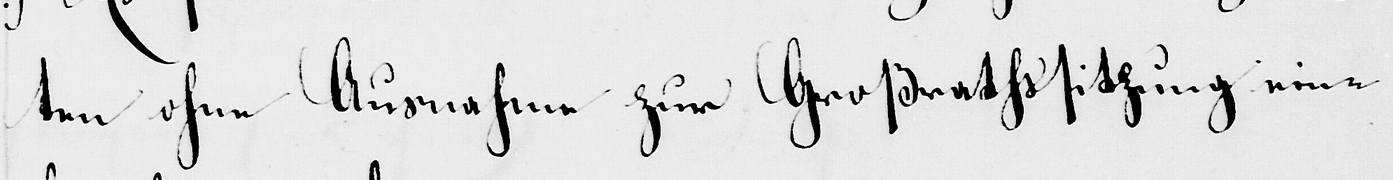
ten ohne Ausnahme zur Großrathssitzung ein¬
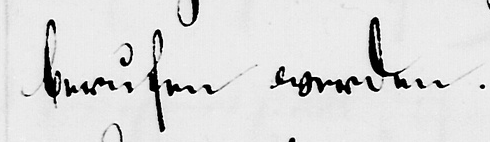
berufen werden.
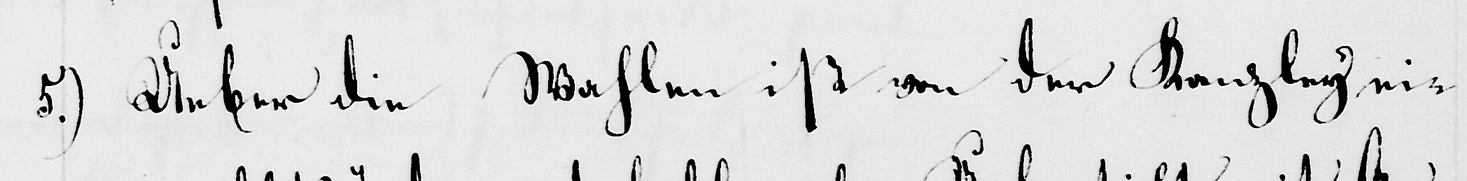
5.) Ueber die Wahlen ist von der Kanzley ei¬
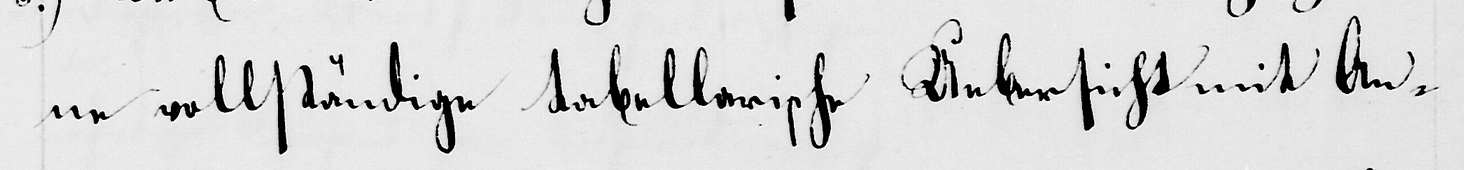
ne vollständige tabellarische Uebersicht mit An-
